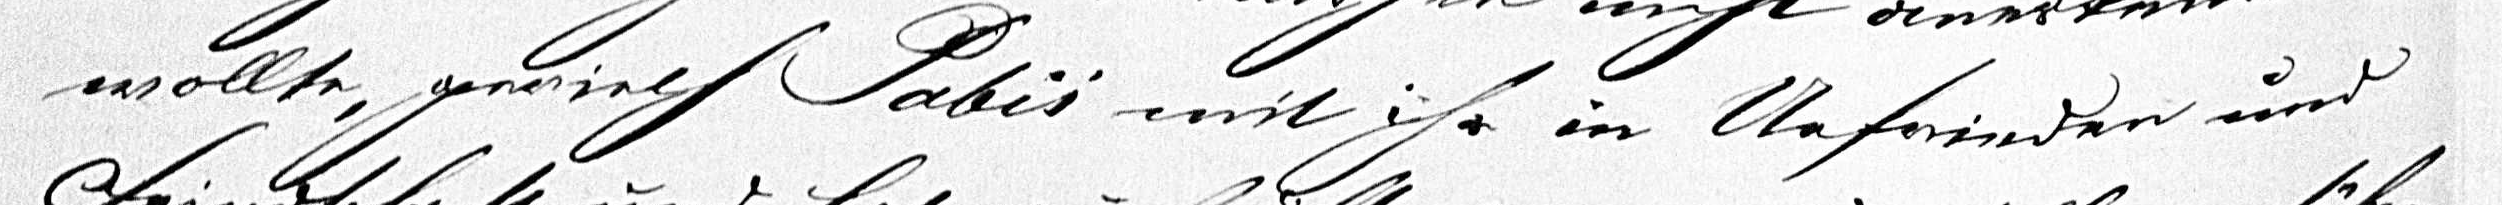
wollte, gerieth Pabiś mit ihr in Unfrieden und
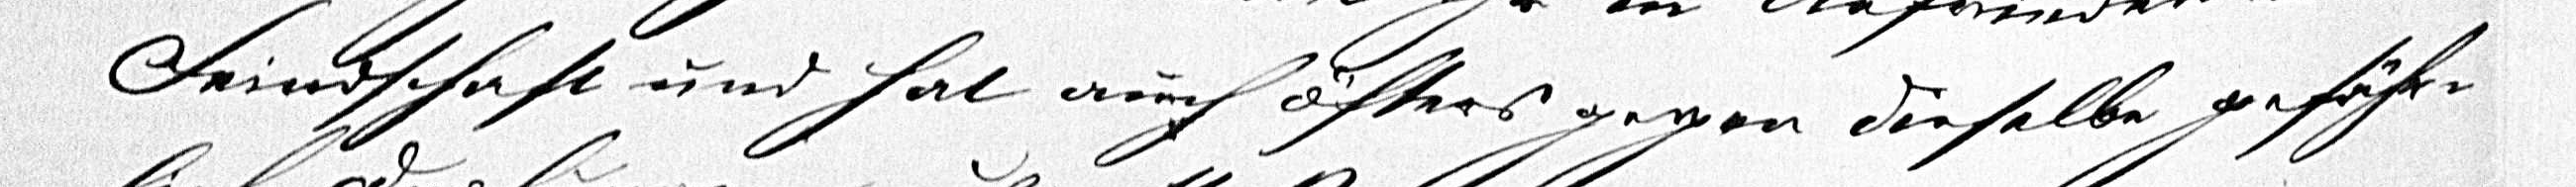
Feindschaft und hat auch öfters gegen dieselbe gefähr¬
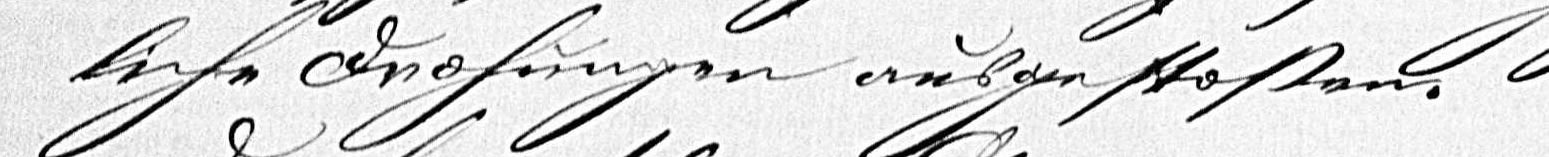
liche Drohungen ausgestoßen.
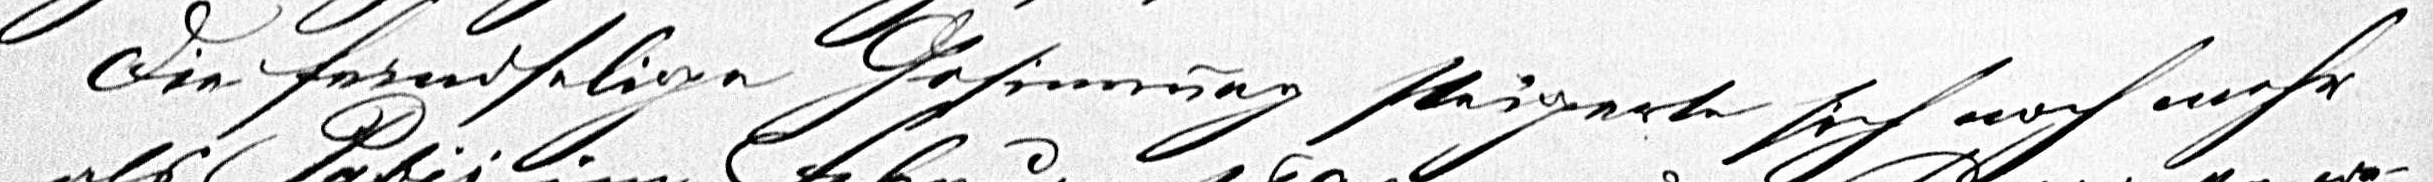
Die Feindselige Gesinnung steigerte sich noch mehr
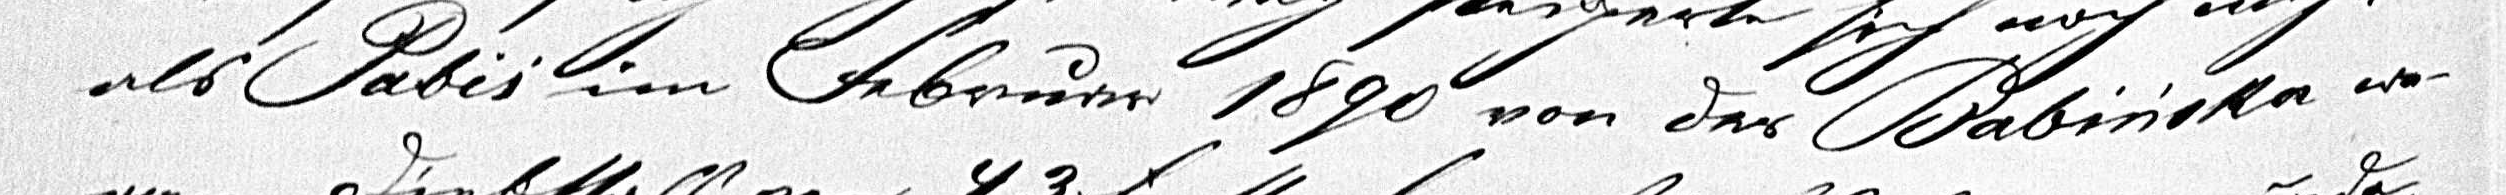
als Pabiś im Februar 1890 von der Babińska we¬
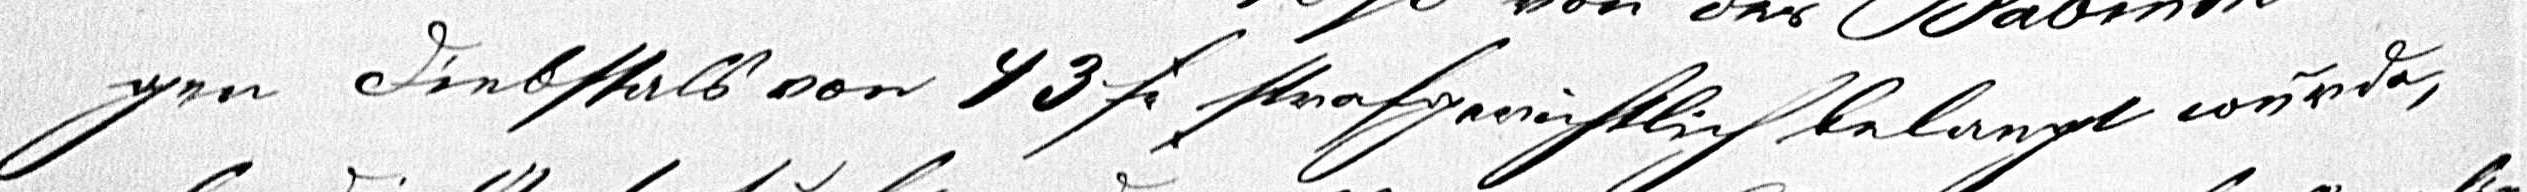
gen Diebstals von 43 f. strafgerichtlich belangt wurde,
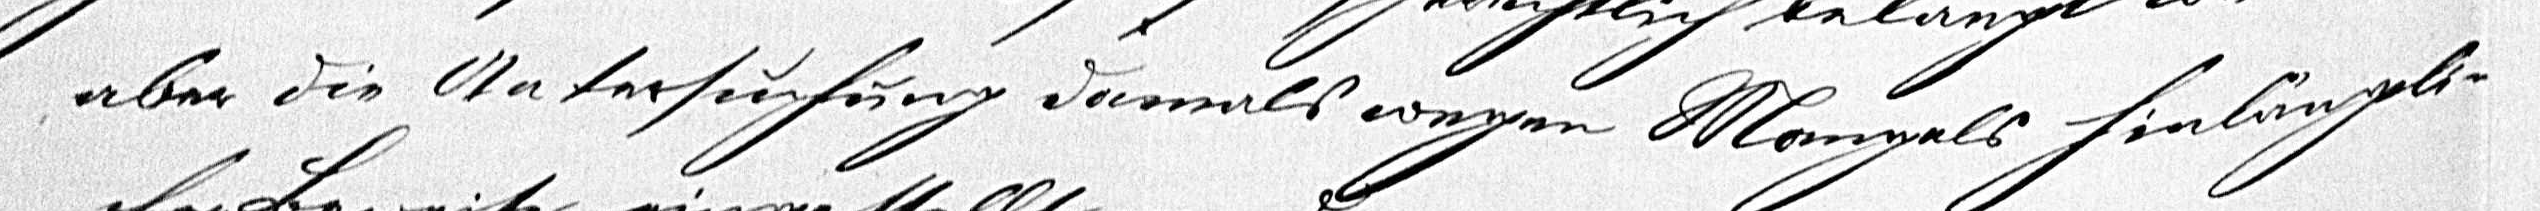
aber die Untersuchung damals wegen Mangels hinlängli¬
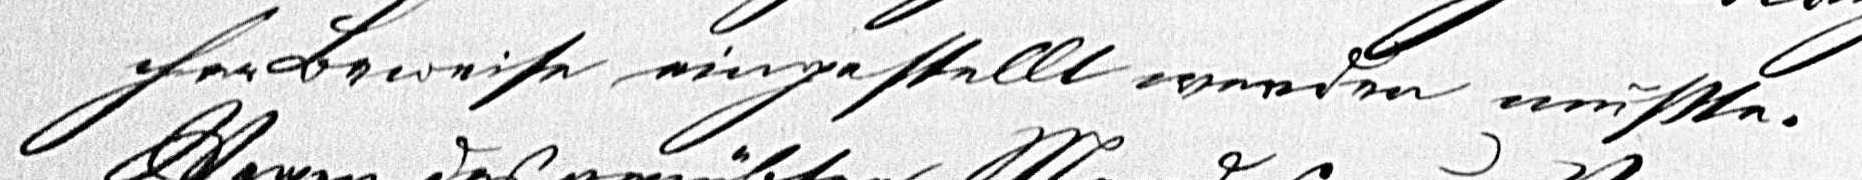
cher Beweise eingestellt werden mußte.
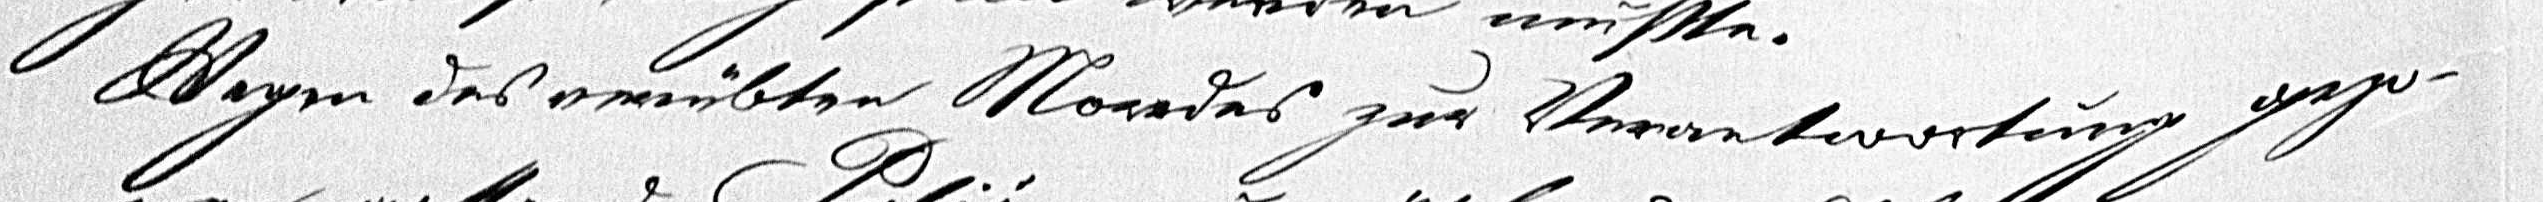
Wegen des verübten Mordes zur Verantwortung gege¬
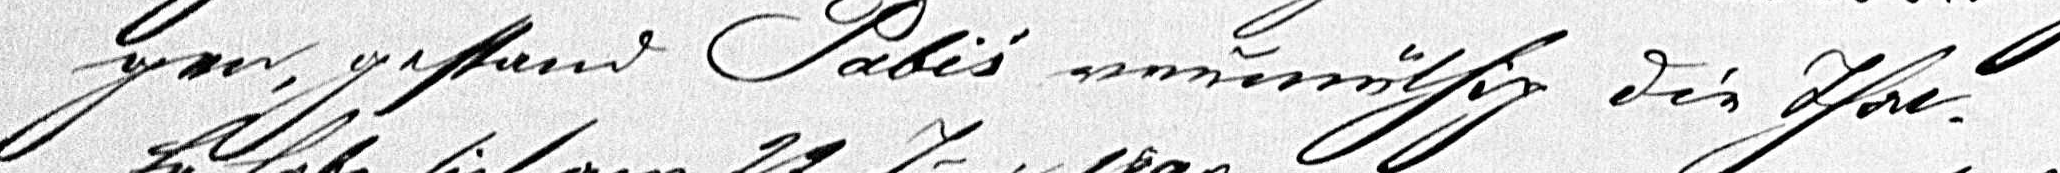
ben, gestand Pabiś reumüthig die That.
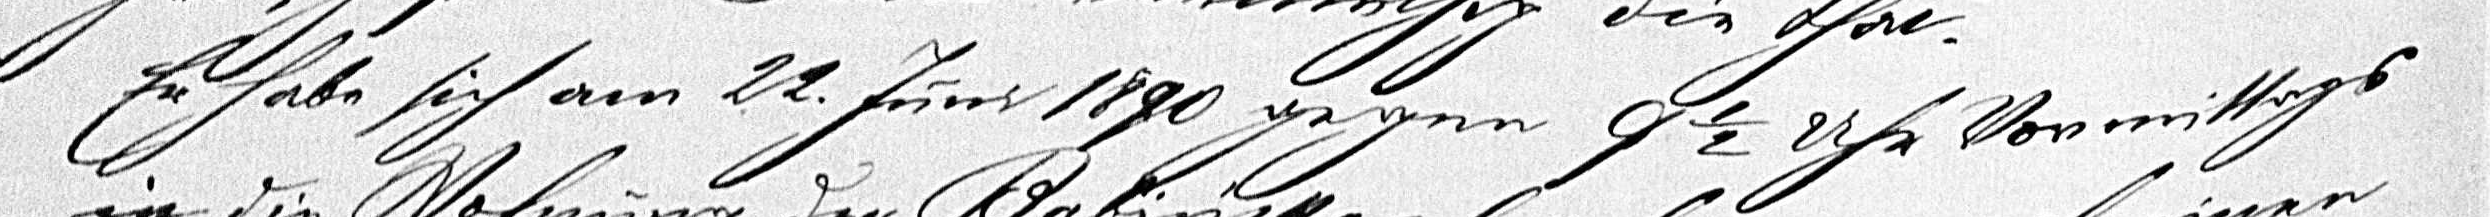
Er habe sich am 22. Juni 1890 gegen 9 1/2 Uhr Vormittags
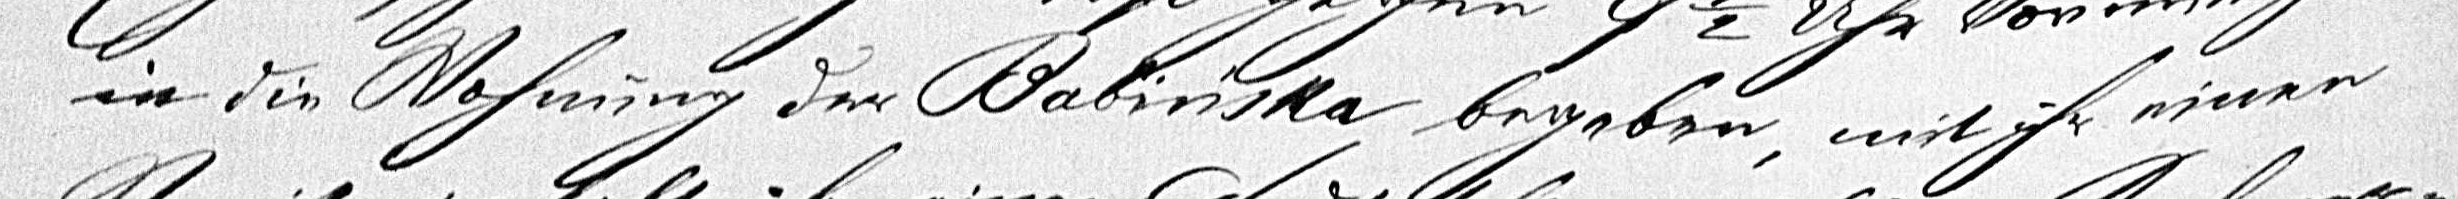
in die Wohnung der Babińska begeben, mit ihr einen
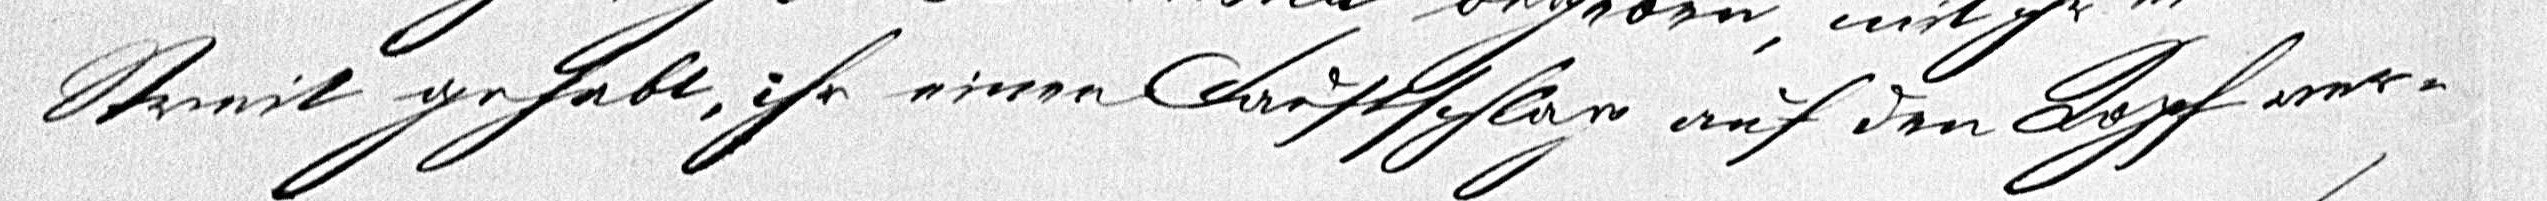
Streit gehabt, ihr einen xx auf den Kopf ver¬
